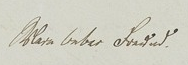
Mein lieber Freund.
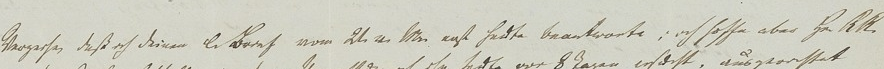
Verzeihe, daß ich deinen l. Brief vom 21. v. Ms. erst heute beantworte; ich hoffe aber Hr. RR.
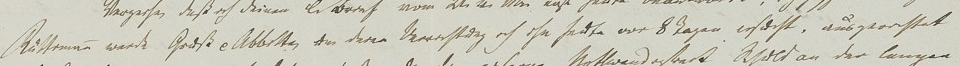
Rüttimann werde Gruß & Abbitte, um deren Verrichtung ich ihn heute vor 8 Tagen ersucht, ausgerichtet
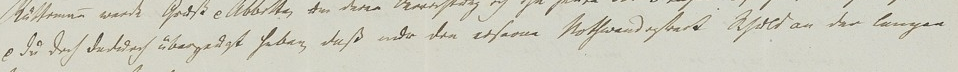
& Du Dich dadurch überzeugt haben, daß nur die eiserne Nothwendigkeit Schuld an der langen
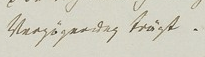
Verzögerung trägt.
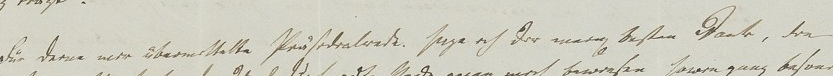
Für Deine mir übermittelte Präsidialrede sage ich Dir meinen besten Dank, die
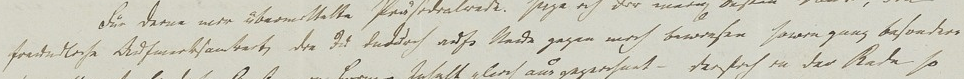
freundliche Aufmersamkeit, die Du dadurch aufs Neue gegen mich bewiesen sowie ganz besonders
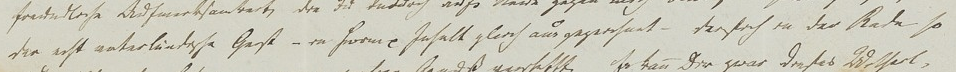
der echt vaterländische Geist – in Form & Inhalt gleich ausgezeichnet – der sich in der Rede so
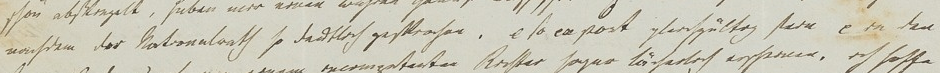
nachdem der Nationalrath so deutlich gesprochen, & so ex post gleichgültig sein & in den
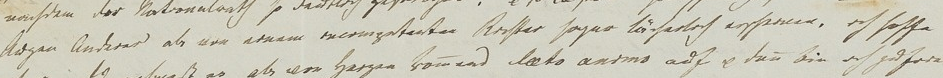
Augen Anderer als von einem incompetenten Richter sogar lächerlich erscheinen, ich hoffe
